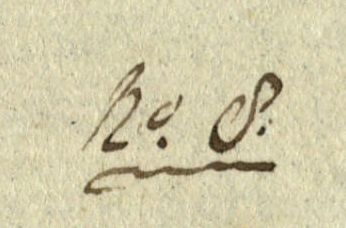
Nº 8.
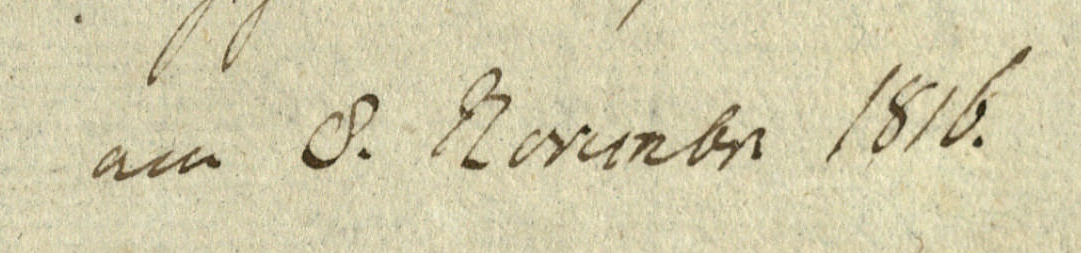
am 8. Novembr. 1816.
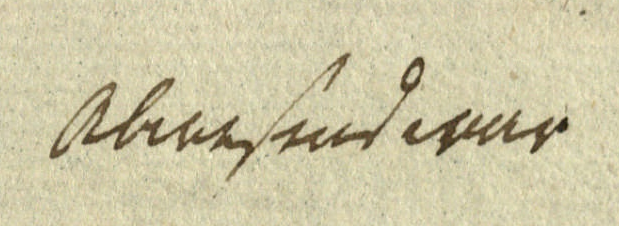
Abwesend war
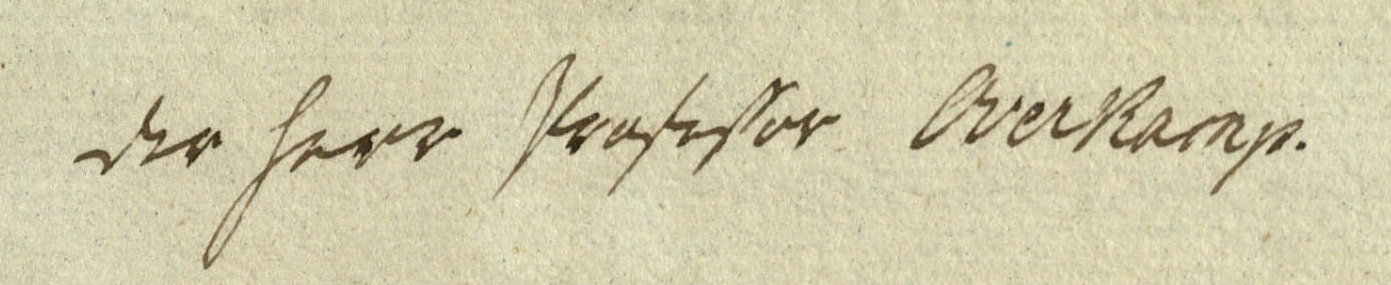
der Herr Professor Overkamp.
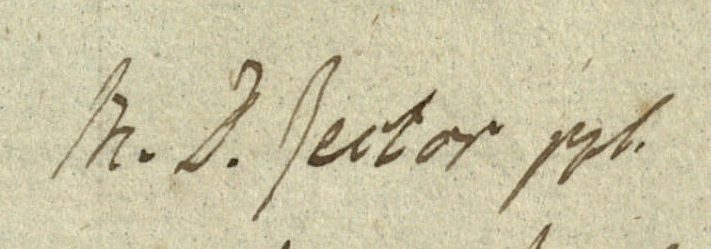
M. D. Rector pt.
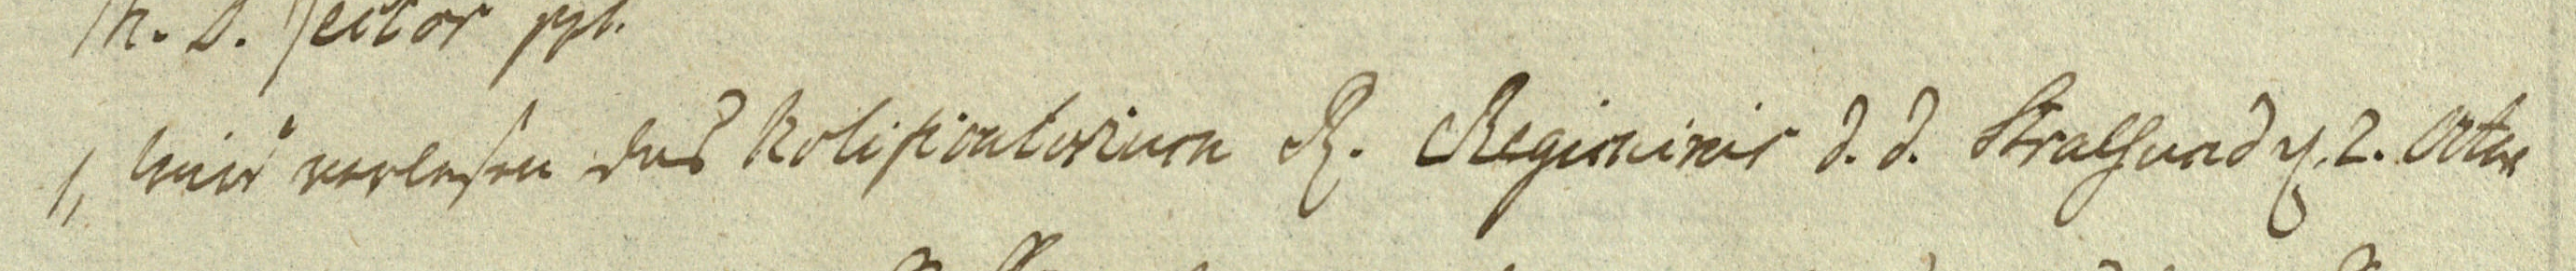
1, Wird vorlesen das Notificatorium R. Regiminis d. d. Stralsund d. 2. Octbr.
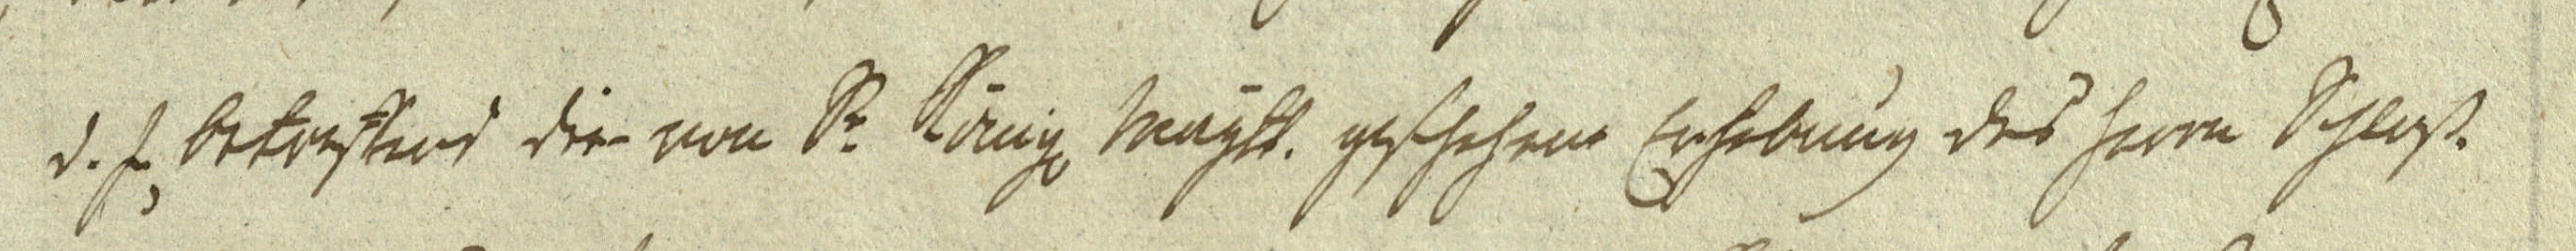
d. J. betreffend die von Sr. König. Maÿtt. geschehene Erhebung des Herrn Schloß¬
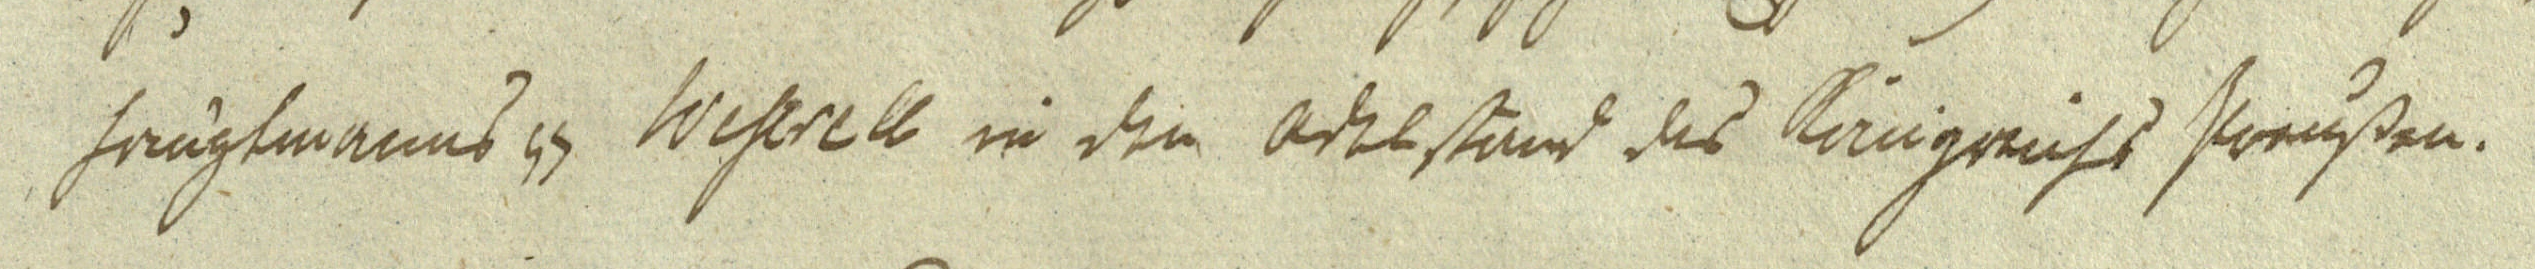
hauptmanns Westrell in den Adelstand des Königreichs Preußen.
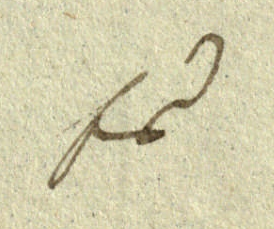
Es
